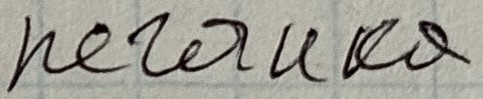пеганка
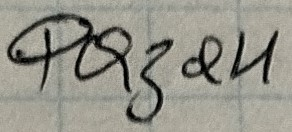фазан
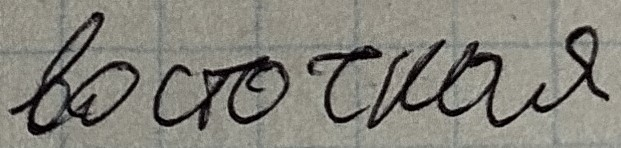восточная
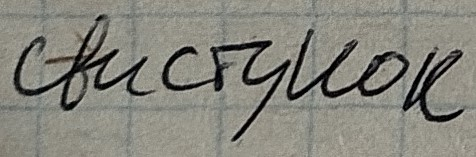свистунок
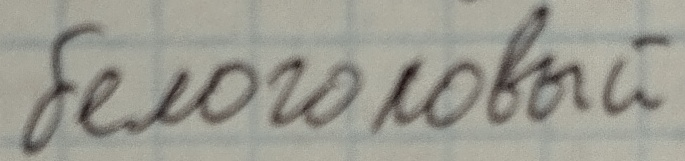белоголовый
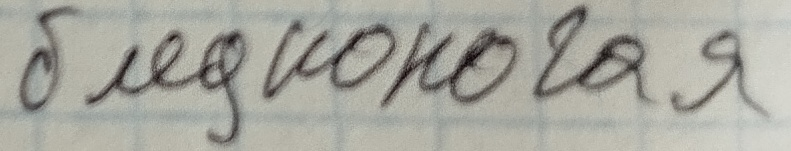бледноногая
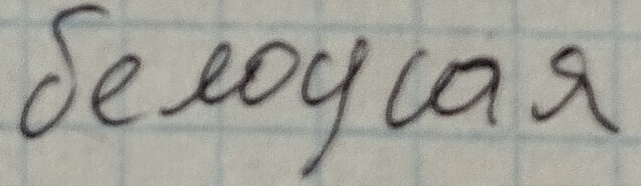белоусая
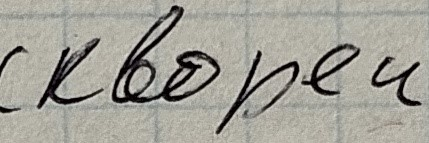скворец
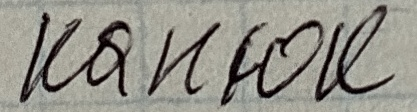канюк
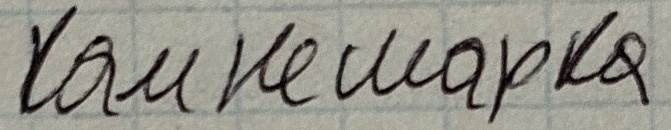камнешарка
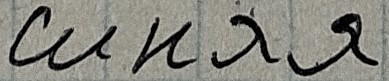синяя
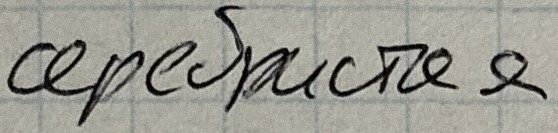серебристая
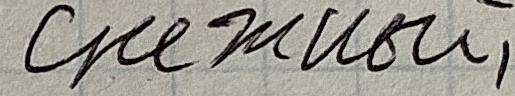снежный
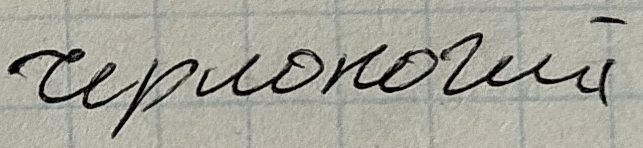черноногий
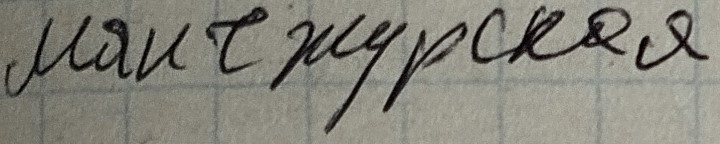манчжурская
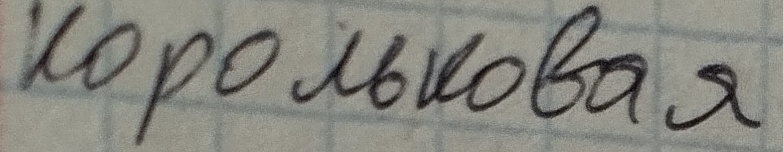корольковая
